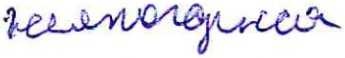желпогорная
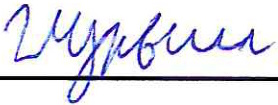глупыш
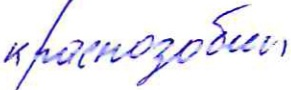краснозобик
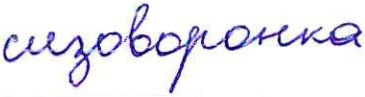сизоворонка
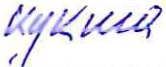кукша
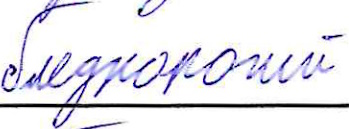бледноногий
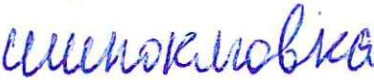шипоклювка
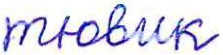тювик
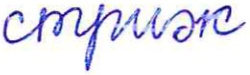стриж
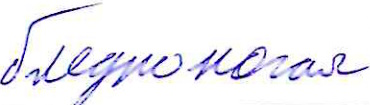бледноногая
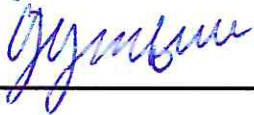дутыш
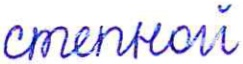степной
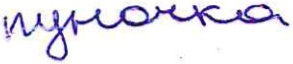пуночка
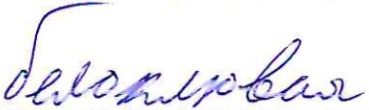белоклювая
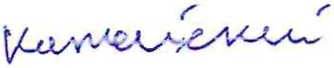китайский
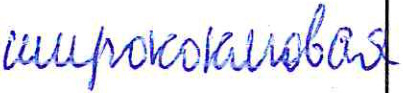ширококлювая
